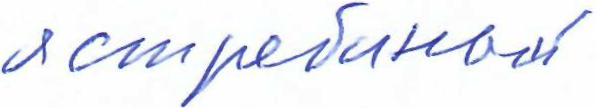ястребиный
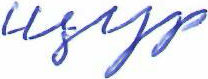щур
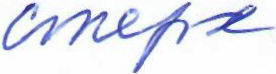стерх
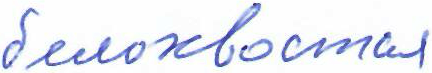белохвостая
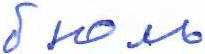бюль
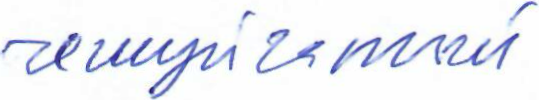чешуйчатый
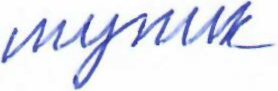тупик
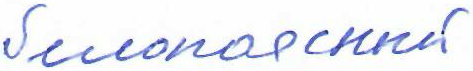белопоясный
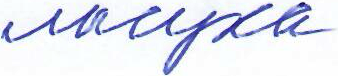лысуха
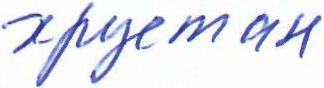хрустан
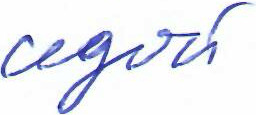седой
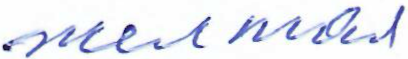желтая
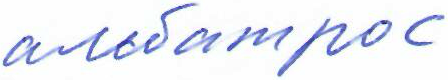альбатрос
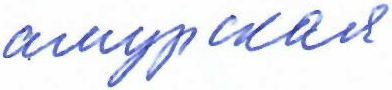амурская
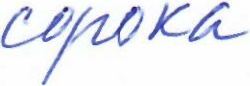сорока
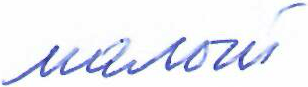малый
